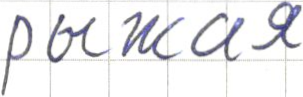рыжая
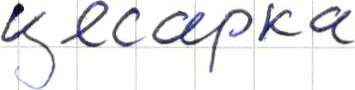цесарка
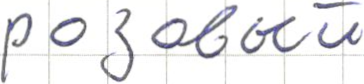розовый
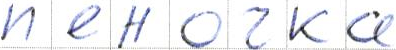пеночка
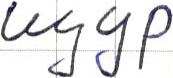щур
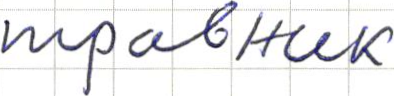травник
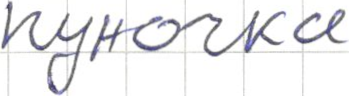пуночка
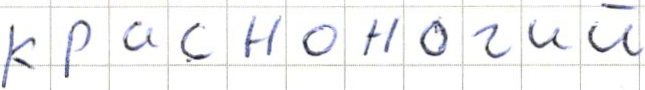красноногий
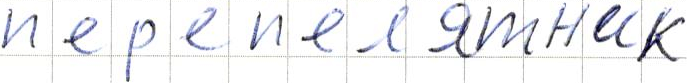перепелятник
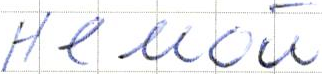немой
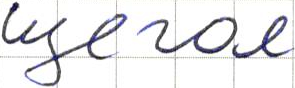щегол
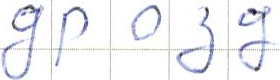дрозд
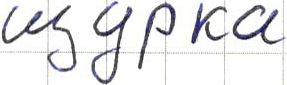щурка
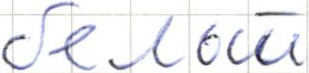белый
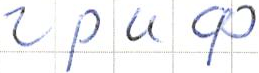гриф
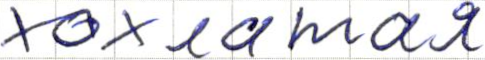хохлатая
